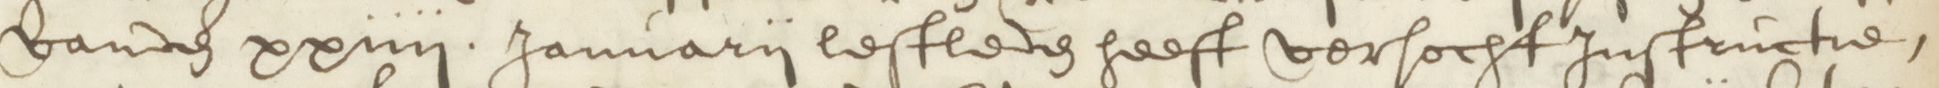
vanden xxiiij. Januarij lestleden heeft versocht Instructie,
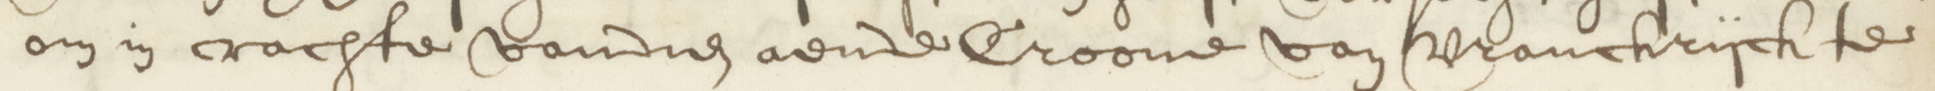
om in crachte vandien aende Croone van Vranckrijck te
